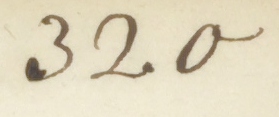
320
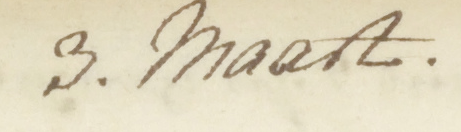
3. Maart.
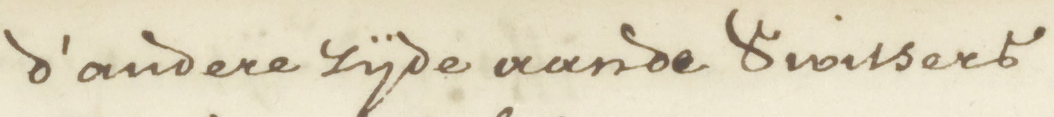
d'andere zijde aande Switsers
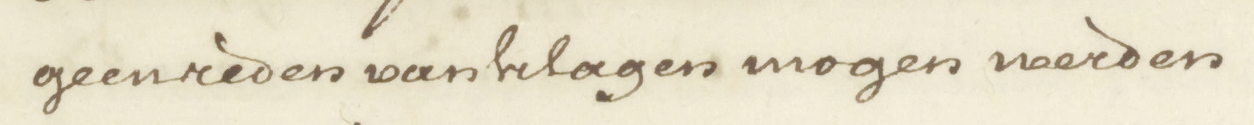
geen reden van klagen mogen werden
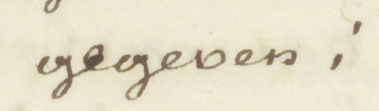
gegeven.
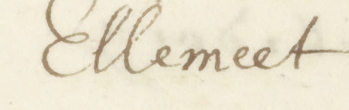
Ellemeet
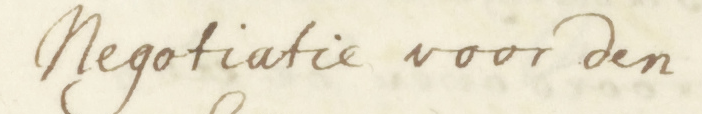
Negotiatie voor den
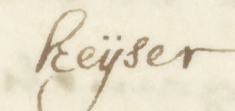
keijser
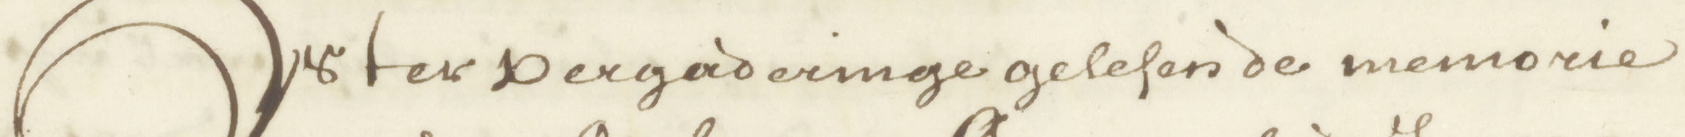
Is ter vergaderinge gelesen de memorie
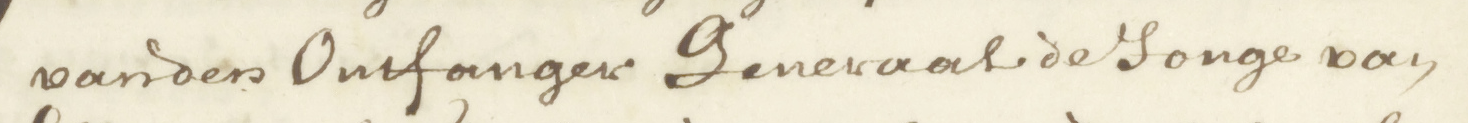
vanden Ontfanger Generaal de Jonge van
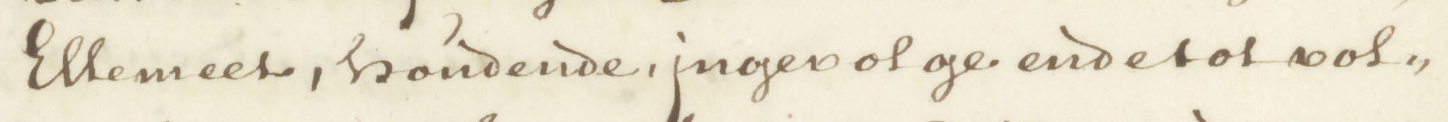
Ellemeet, houdende, ingevolge ende tot vol„
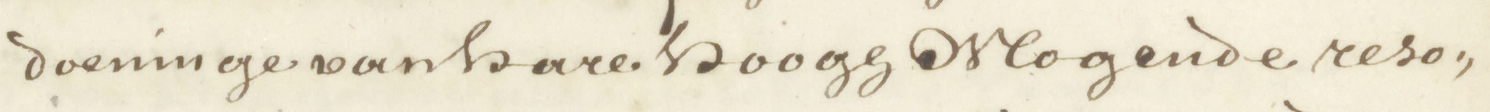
doeninge van hare Hoogh Mogende reso,
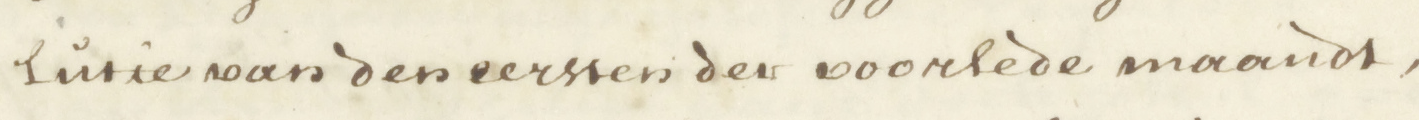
lutie van den eersten der voorlede maandt
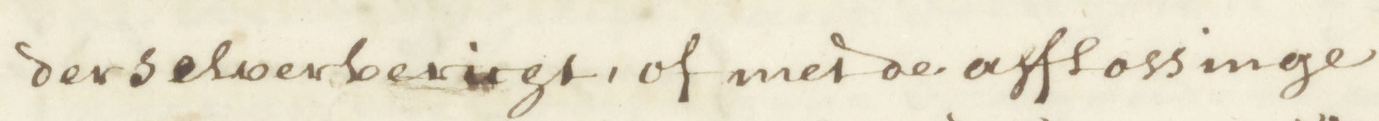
derselver bericht, of met de afflossinge
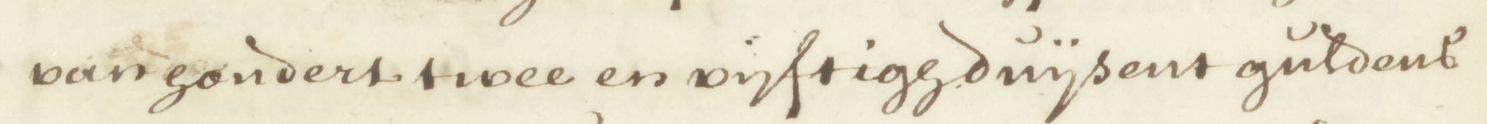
van hondert twee en vijftighduijsent guldens
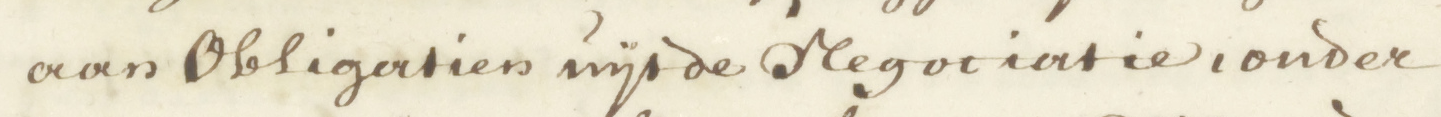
aan Obligatien uijt de Negociatie, onder
